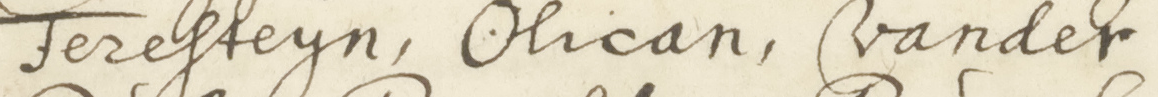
Teresteijn, Olican, vander
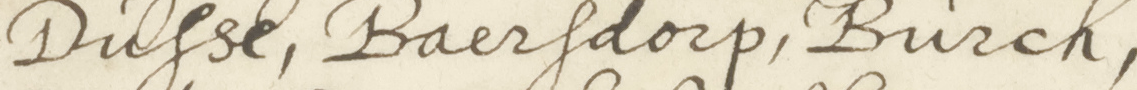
Dusse, Baersdorp, Burch,
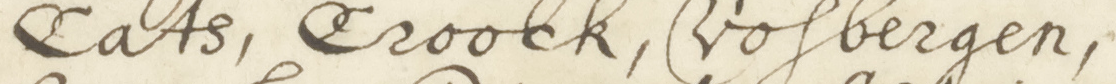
Cats, Croock, Vosbergen.
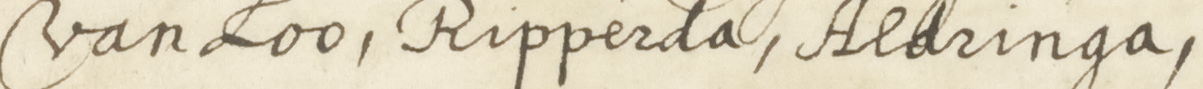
van Loo, Ripperda, Aldringa,
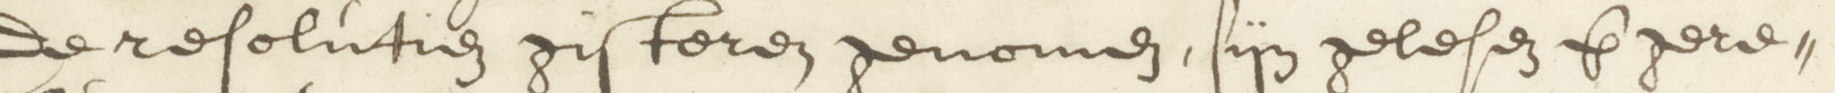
De resolutien gisteren genomen, sijn gelesen & gere„
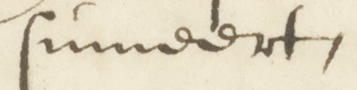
sumeert.
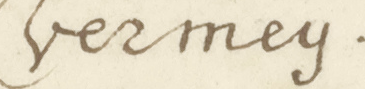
Vermeij.
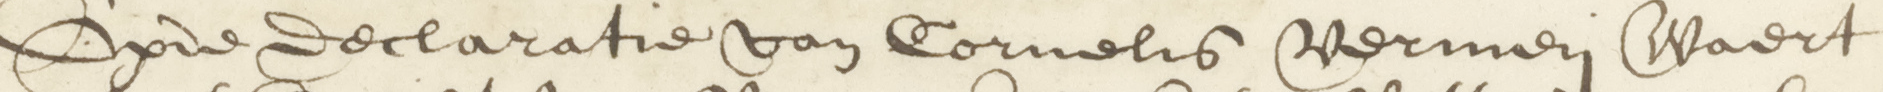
Opde declaratie van Cornelis Vermeij Waert
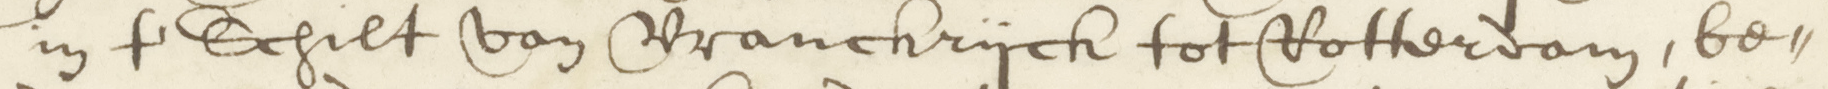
in t'Schilt van Vranckrijck tot Rotterdam, be„
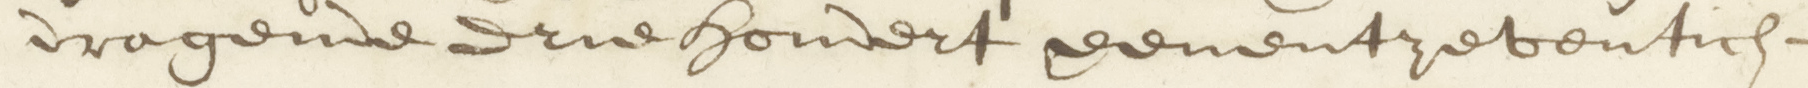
dragende drie hondert eenentzeventich
